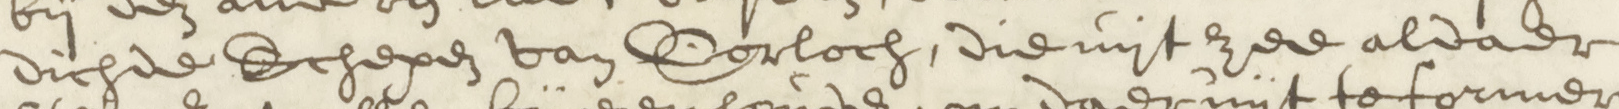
dichde Schepen van Oorloch, die uijt zee aldaer
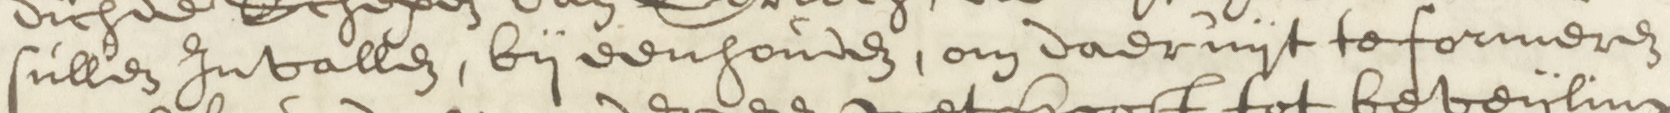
sullen Invallen, bij eenhouden, om daer uijt te formeren
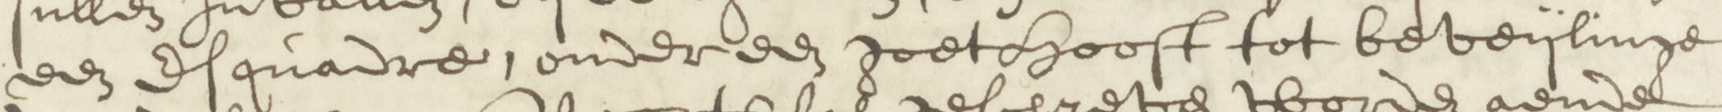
een Esquadre, onder een goet Hooft tot beveijlinge
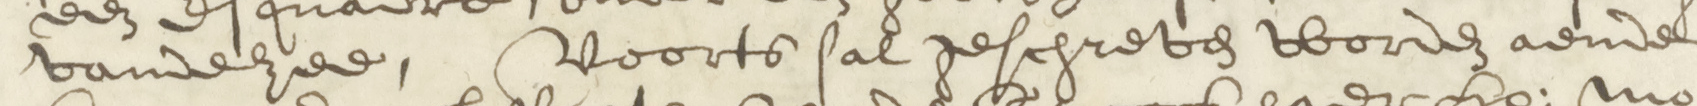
vande zee. Voorts sal geschreven worden aende
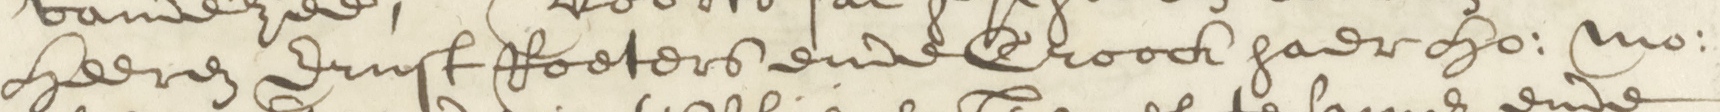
Heeren Ernst Roeters ende Croock haer Ho:Mo:
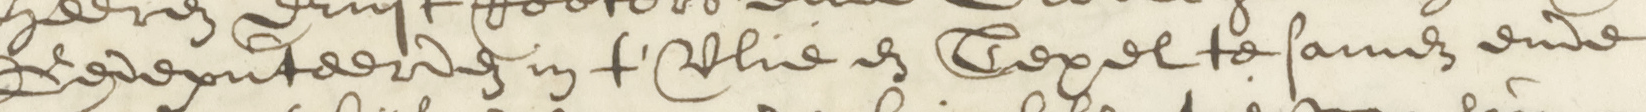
Gedeputeerden in t'Vlie en Texel te samen ende
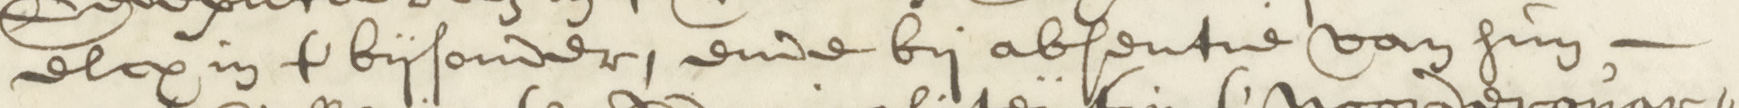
elcx in t'bijsonder, ende bij absentie van hun —
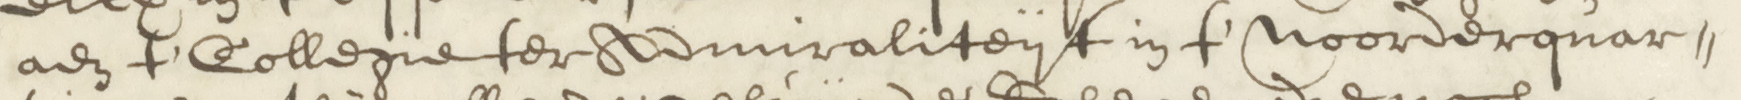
aen t'Collegie ter Admiraliteijt in t'Noorderquar„
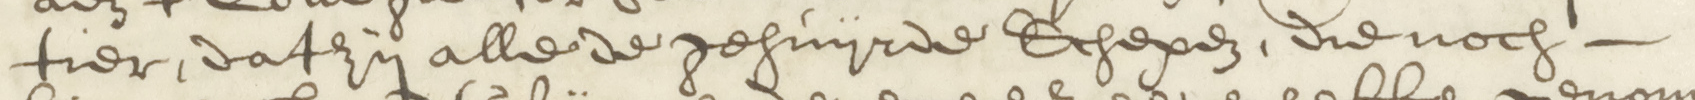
tier, dat zij alle de gehuijrde Schepen, die noch —
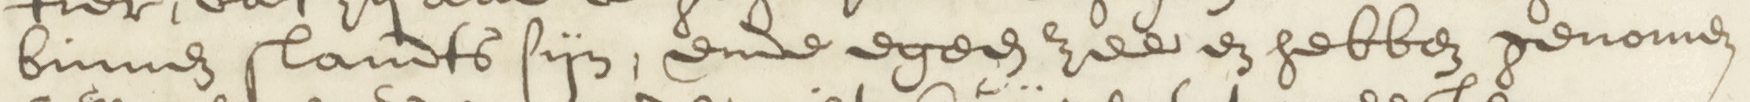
binnen slandts sijn, ende egeen zee en hebben genomen,
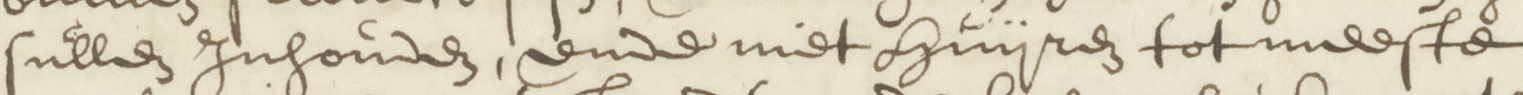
sullen Inhouden, ende niet huijren tot meeste
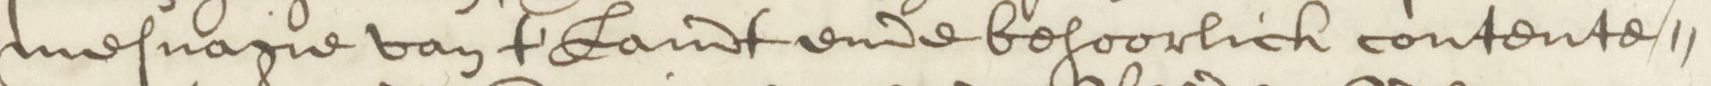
mesnagie van t'Landt ende behoorlick contente„
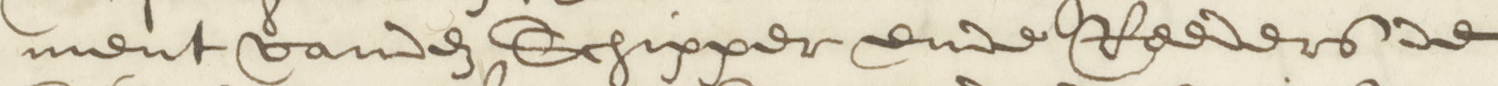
ment vanden Schipper ende Reeders de
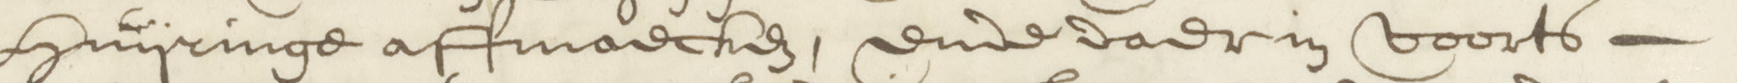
huijringe affmaecken, ende daerin voorts —
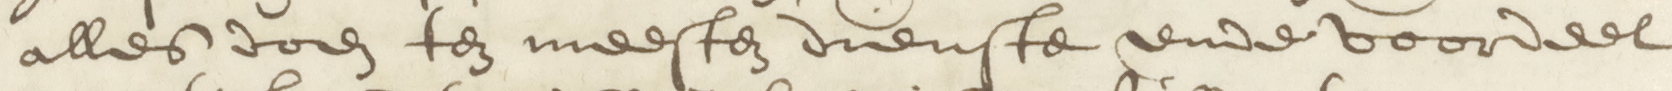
alles doen ten meesten dienste ende voordeel
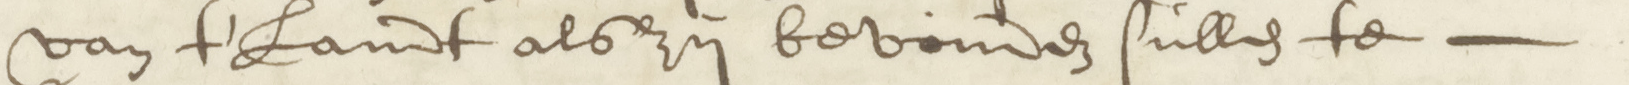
van t'Landt als zij bevonden sullen te —
